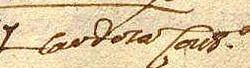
cardoza Cout.o
